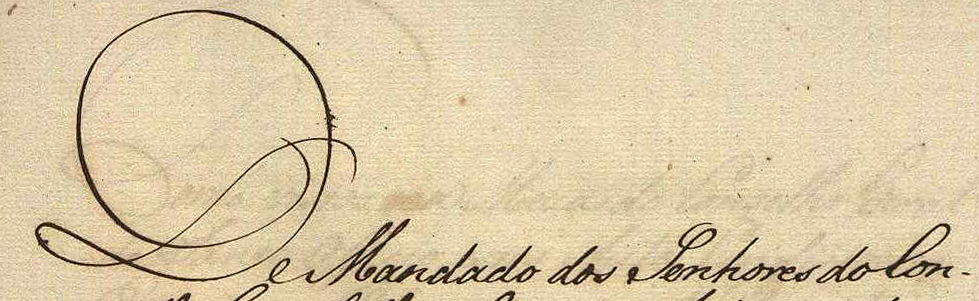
De Mandado dos Senhores do Con
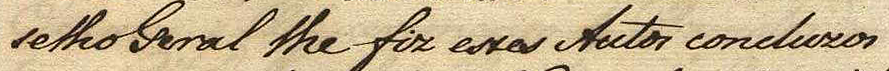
selho Geral lhe fiz estes Autos conclusos
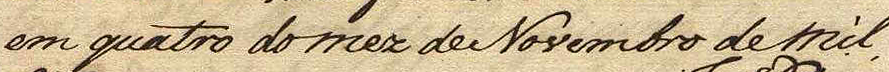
em quatro do mez de Novembro de mil,
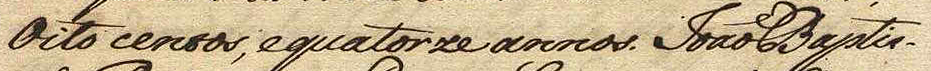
oitocento, e quatorze annos. Ioaõ Baptis
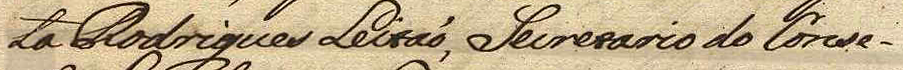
ta Rodrigues Leitaõ, Secretario do Conse
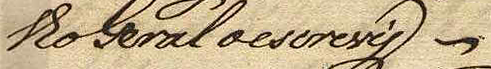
lho Geral o escrevi
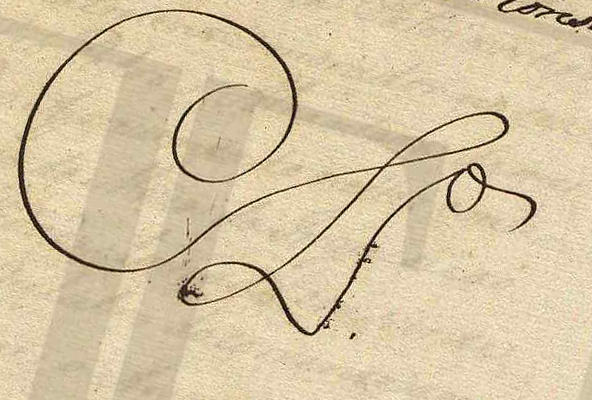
CL.o
